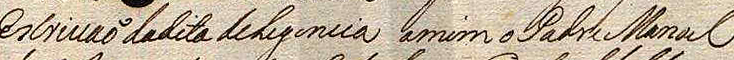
Escriuaõ da dita deLegencia a mim o Padre Manoel
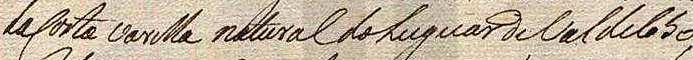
da Costa varella natural do Luguar de Valdelobo,
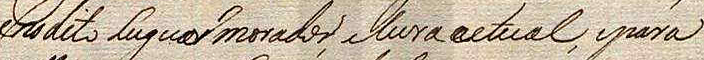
e no dito Luguar morador, e Cura actual, e para
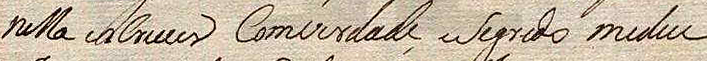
nella esCreuer Com verdade, e segredo me deu
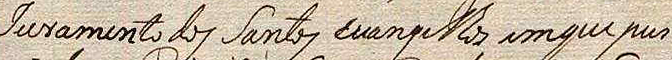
Iuramento dos Santos Euangelhos, em que pus
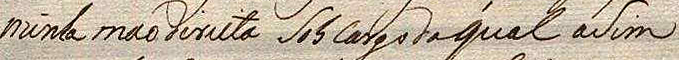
minha mao direita sobCargo do qual aSim
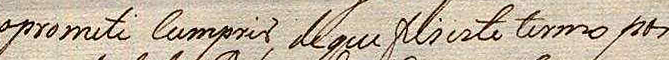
o prometi Cumprir, de que fis este termo por
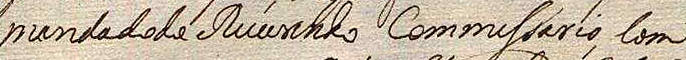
mandado de Reuerendo Commissario, Com
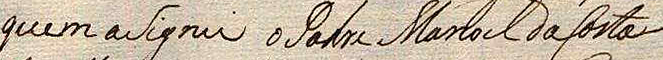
quem asignei o Padre Manoel da Costa
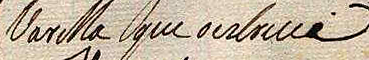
Varella que o esCreui
